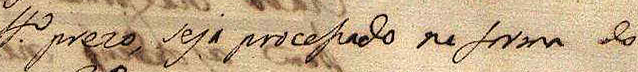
eff.o prezo, seja processado na forma do
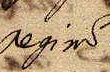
regim.to
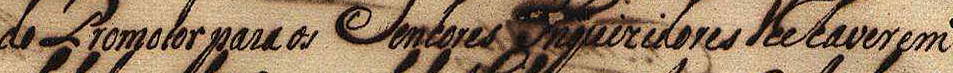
do Promotor para os Senhores Inquizidores lhe haverem
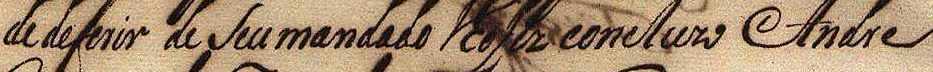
de deferir de Seu mandado lho fez concluzo Andre
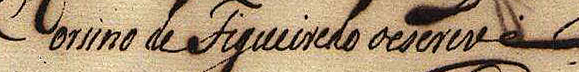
Corsino de Figueiredo o escrevi
